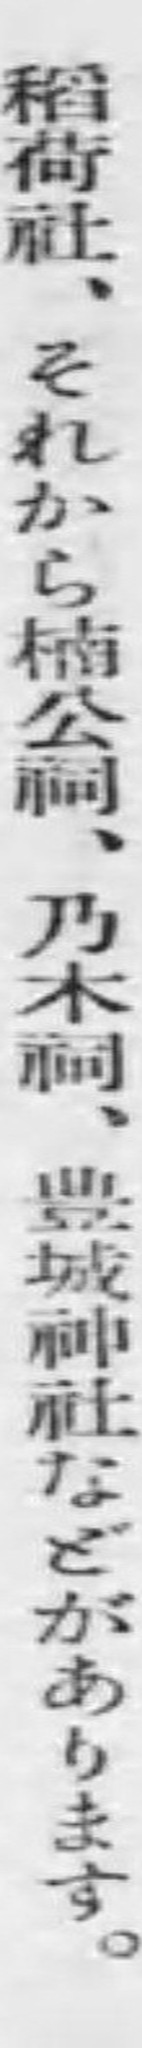稲荷社、それから楠公祠、乃木祠、豊城神社などがあります。
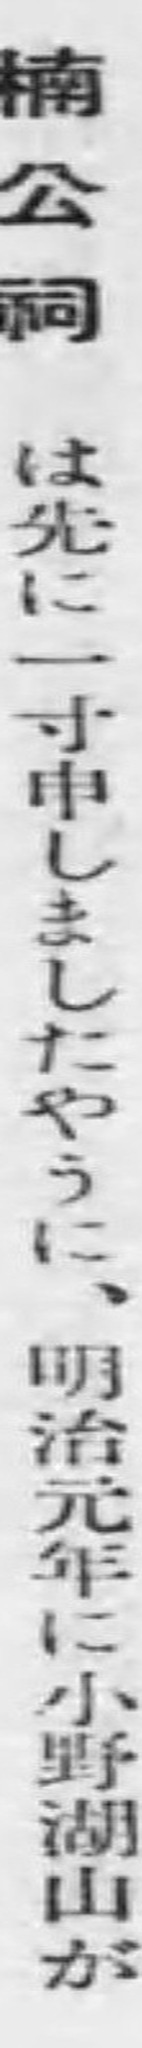楠公祠は先に一寸申しましたやうに、明治元年に小野湖山が
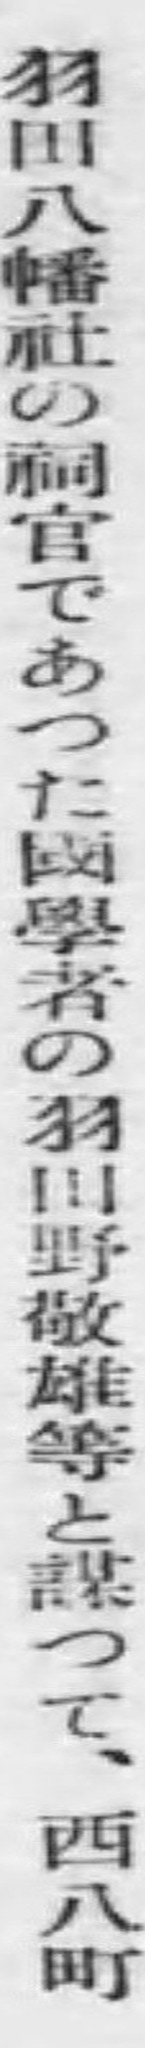羽田八幡社の祠官であつた国学者の羽田野敬雄等と謀つて、西八町
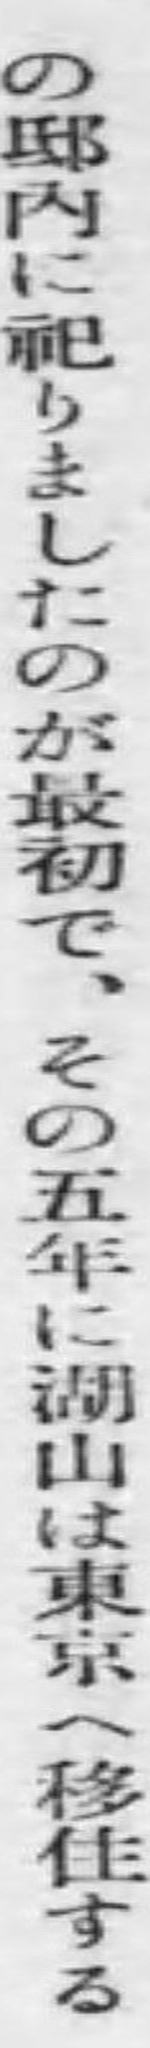の邸内に祀りましたのが最初で、その五年に湖山は東京へ移住する
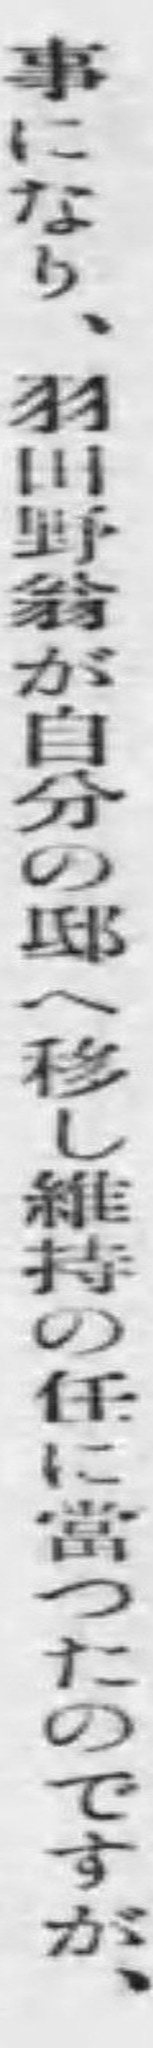事になり、羽田野翁が自分の邸へ移し維持の任に当つたのですが、
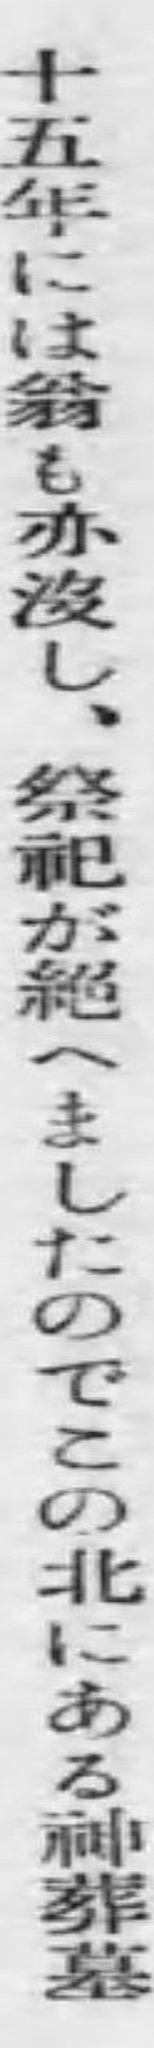十五年には翁も亦没し、祭祀が絶へましたのでこの北にある神葬墓
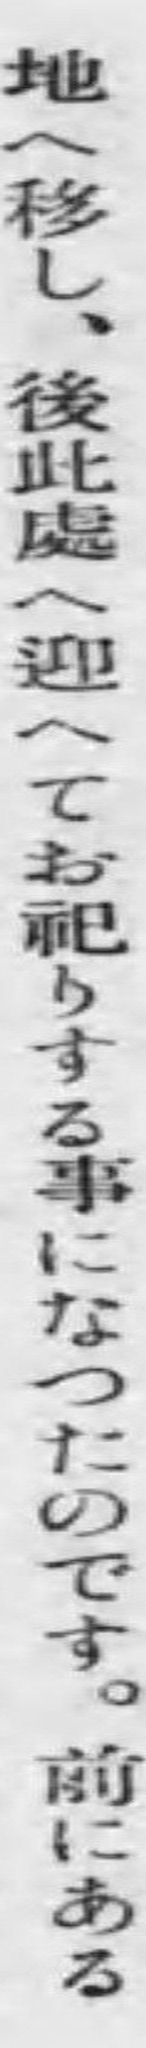地へ移し、後此処へ迎へてお祀りする事になつたのです。前にある
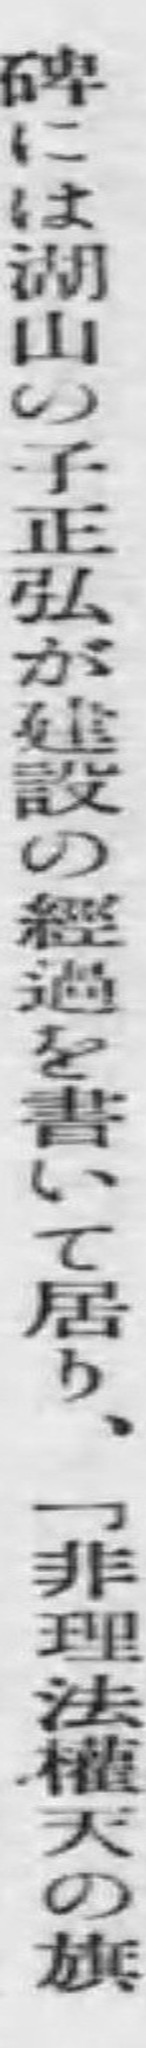碑には湖山の子正弘が建設の経過を書いて居り、「非理法権天の旗
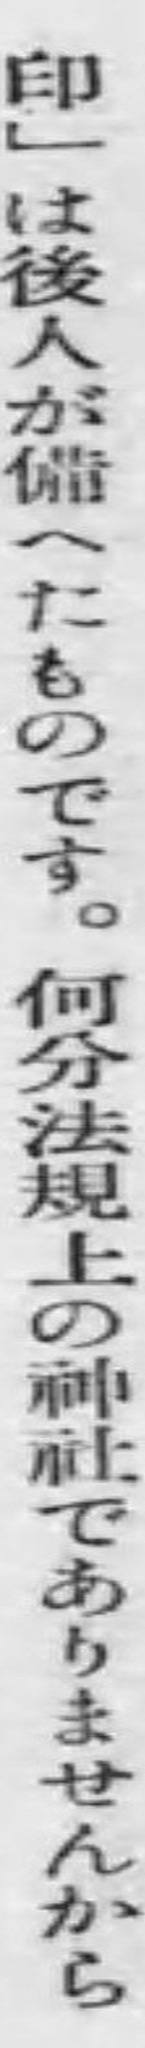印」は後人が備へたものです。何分法規上の神社でありませんから
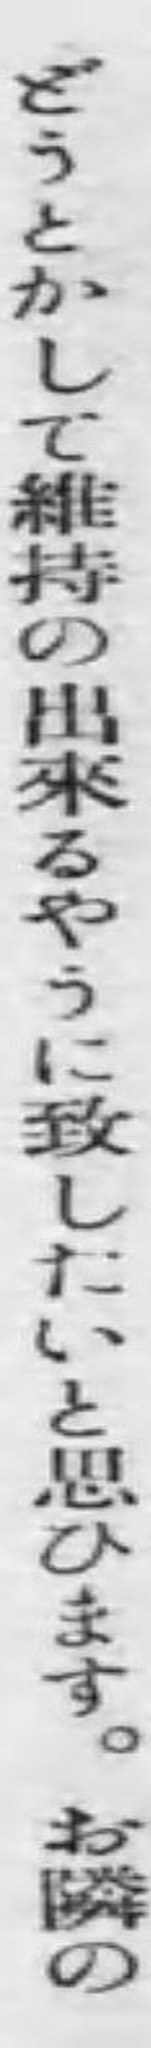どうとかして維持の出来るやうに致したいと思ひます。お隣の
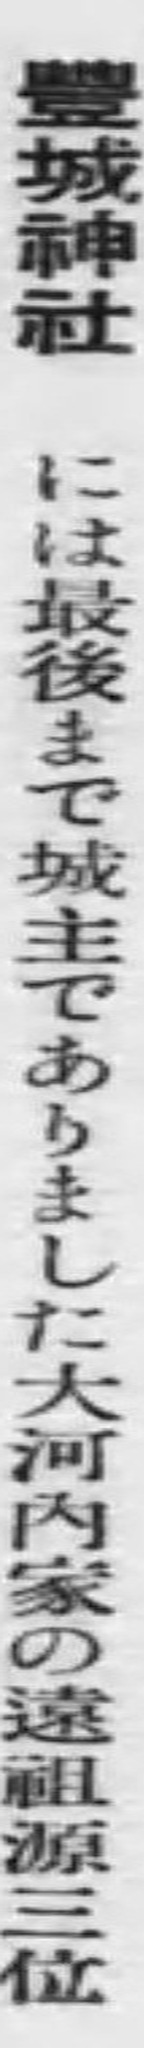豊城神社には最後まで城主でありました大河内家の遠祖源三位
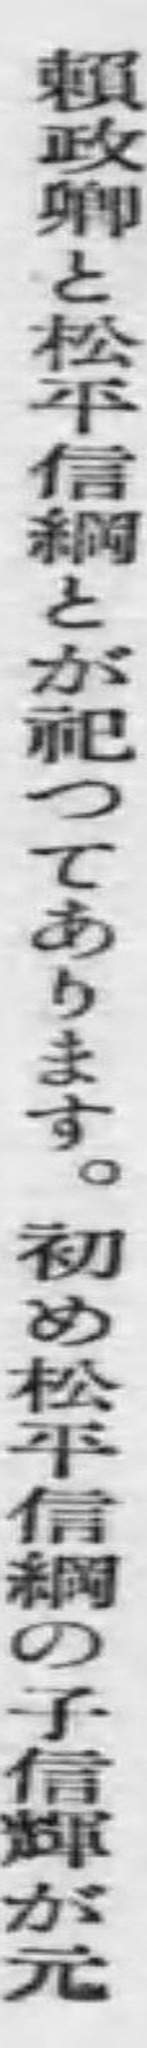頼政卿と松平信綱とが祀つてあります。初め松平信綱の子信輝が元
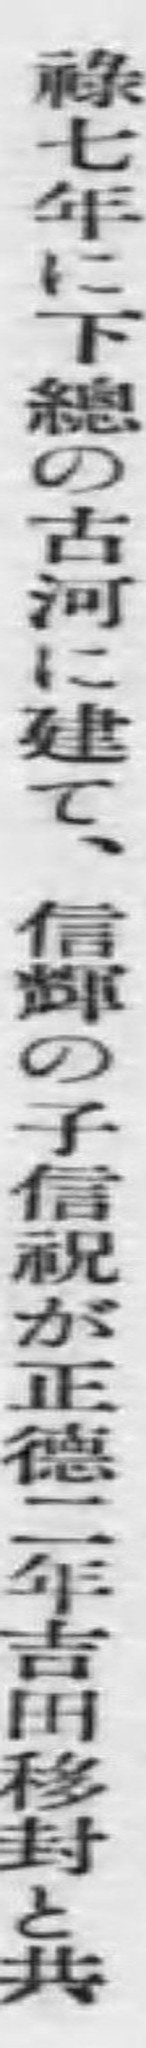禄七年に下総の古河に建て、信輝の子信祝が正徳二年吉田移封と共
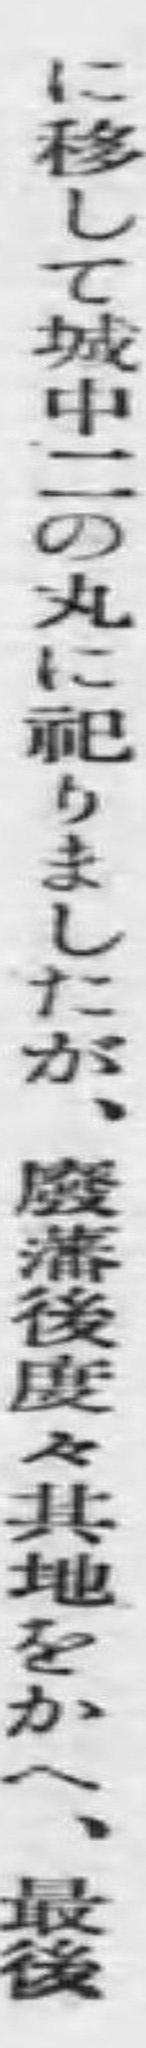に移して城中二の丸に祀りましたが、廃藩後度々其地をかへ、最後
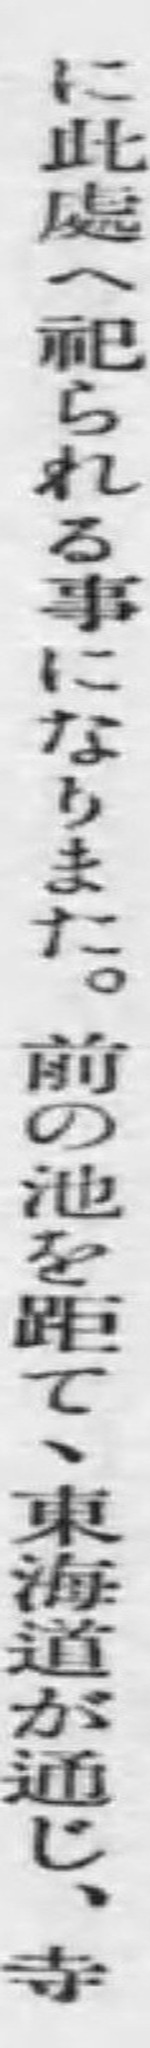に此処へ祀られる事になりまた。前の池を距てゝ東海道が通じ、寺
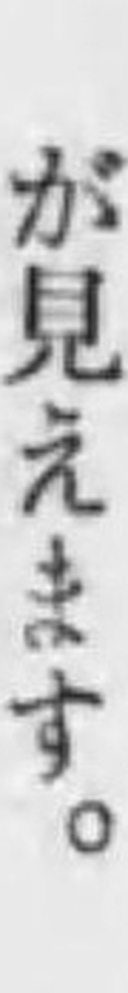が見えます。
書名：東三河道中記 : 豊橋市及其附近案内
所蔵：国立国会図書館 National Diet Library, JAPAN
